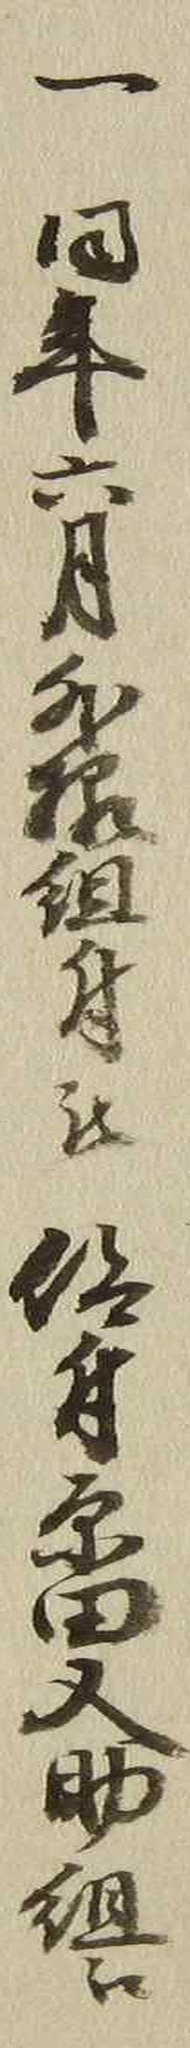一同年六月外様組付被仰付原田又助組江
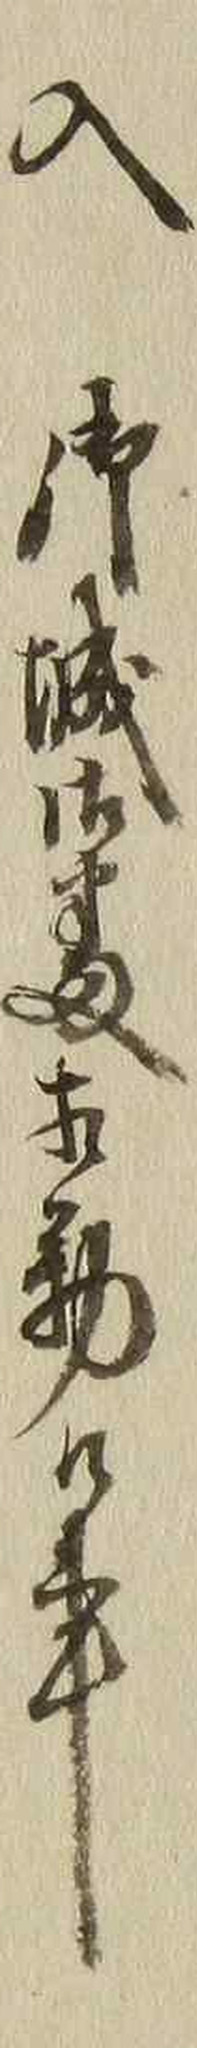入御城御番相勤候事
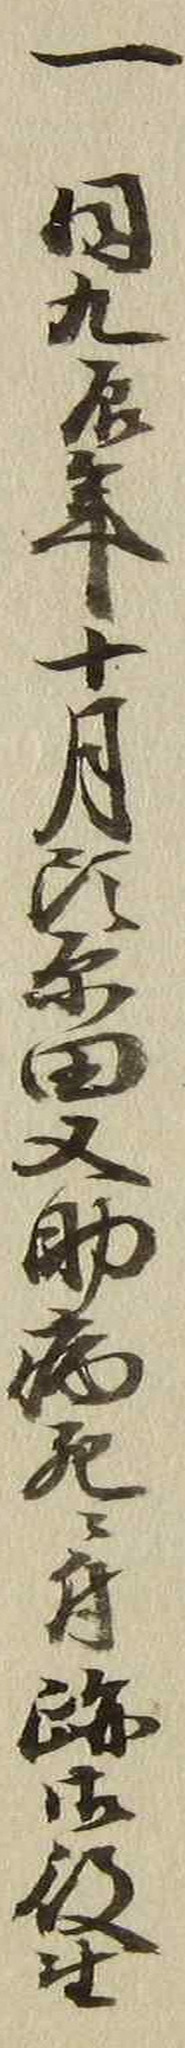一同九辰年十月頭原田又助病死ニ付跡御役生
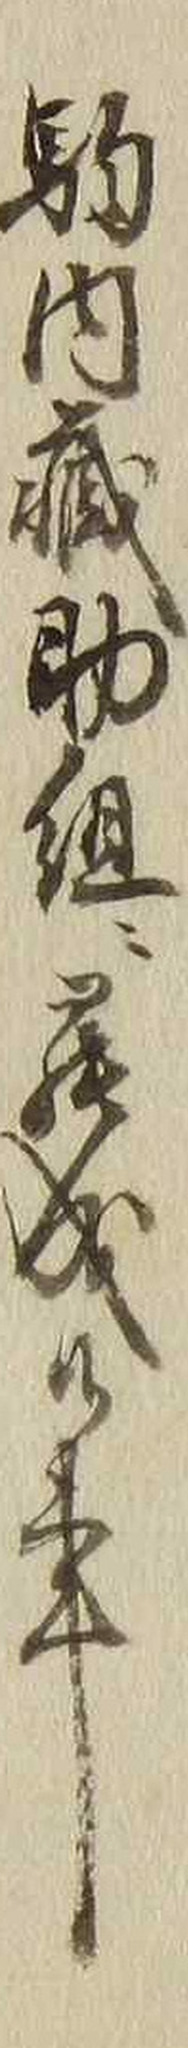駒内蔵助組ニ罷成候事
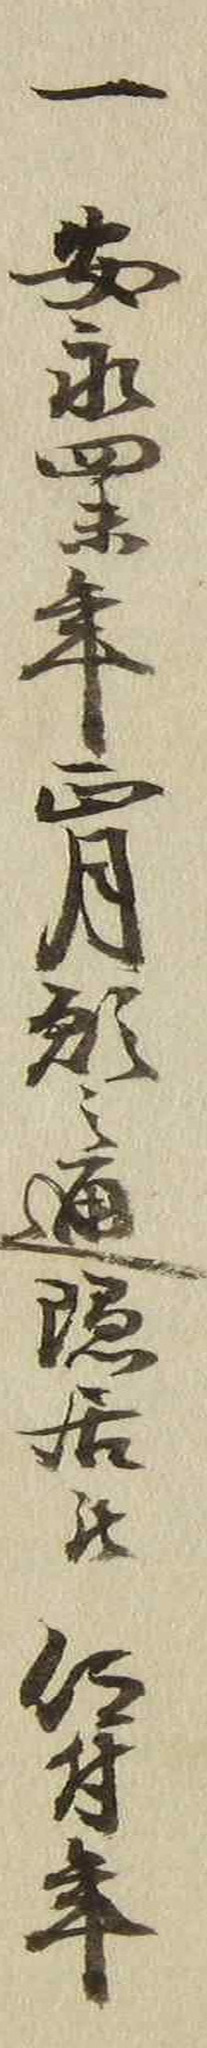一寛永四未年正月願之通隠居被仰付年
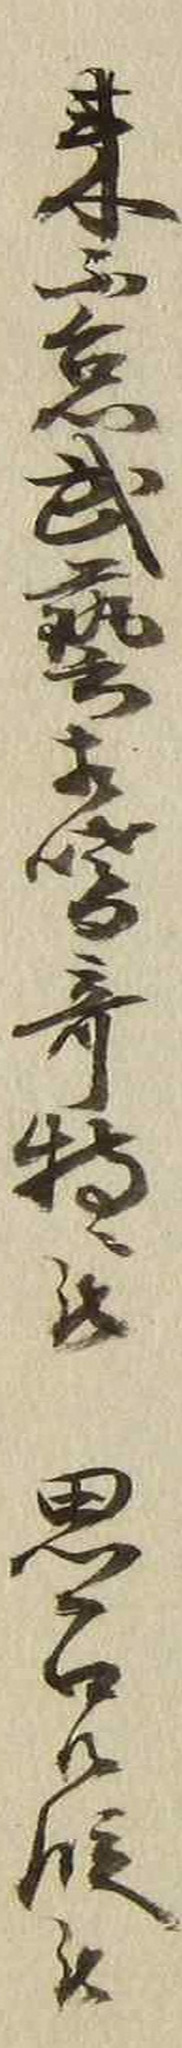来不怠武芸相嗜奇特ニ被思召候段被
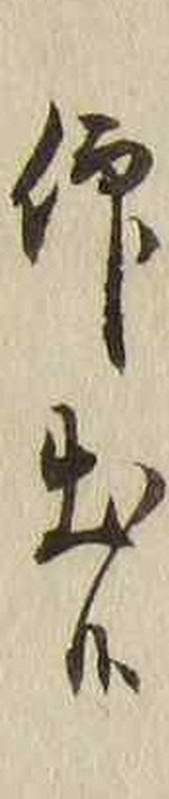仰出候

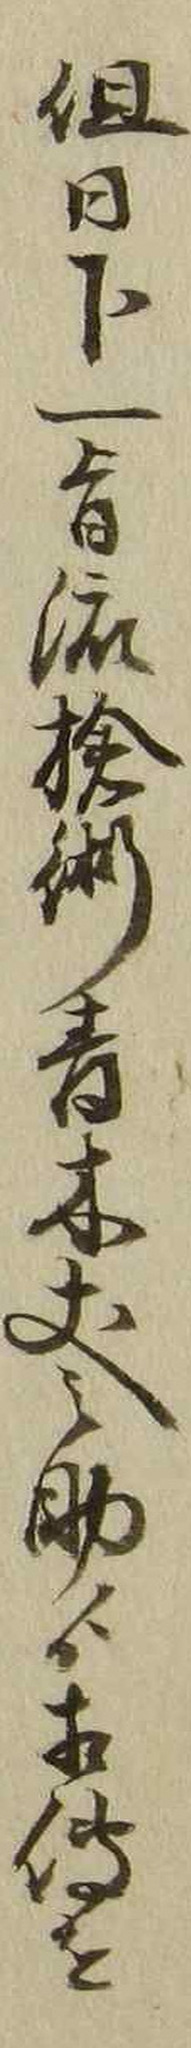但日下一旨流槍術青木丈之助ゟ相伝を
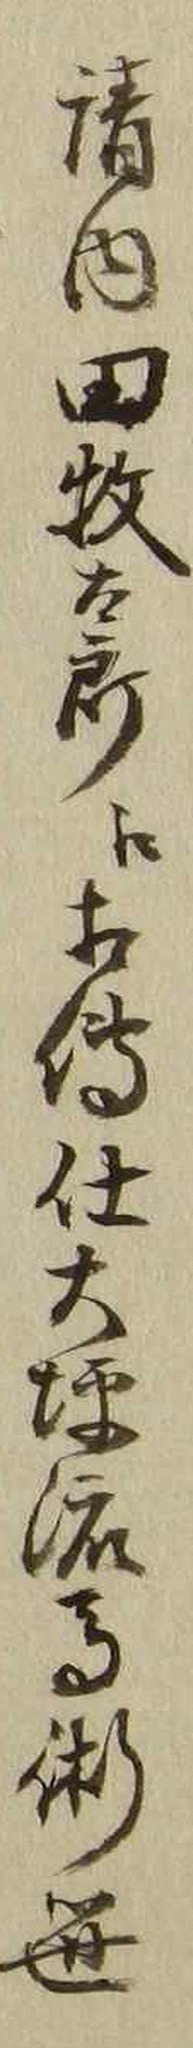請内田牧太郎江相伝仕大坪流馬術笹
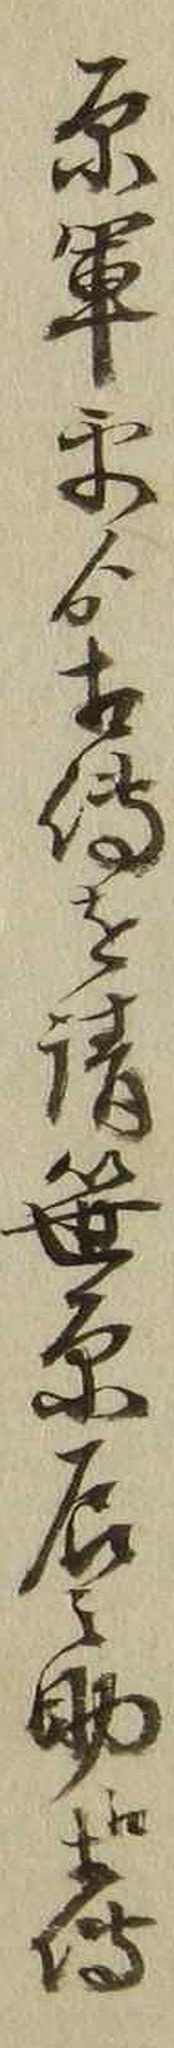原軍平ゟ相伝を請笹原辰之助江相伝
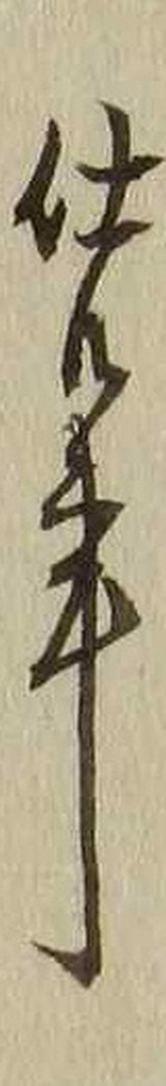仕候事
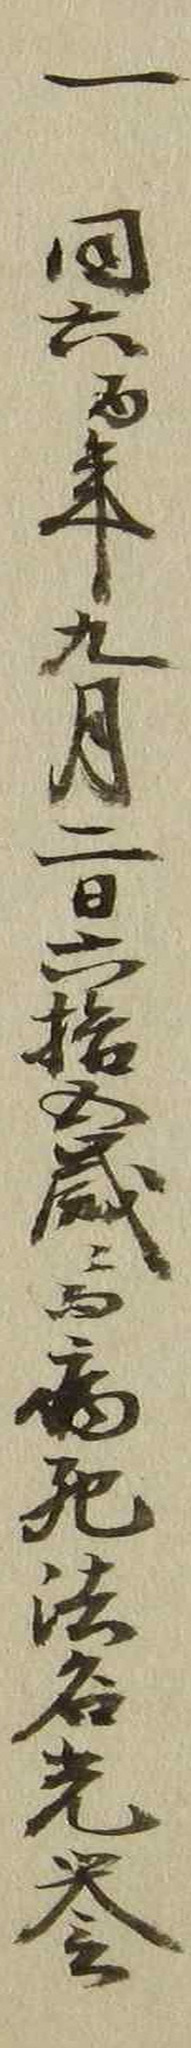一同六酉年九月二日六拾五歳ニ而病死法名光誉
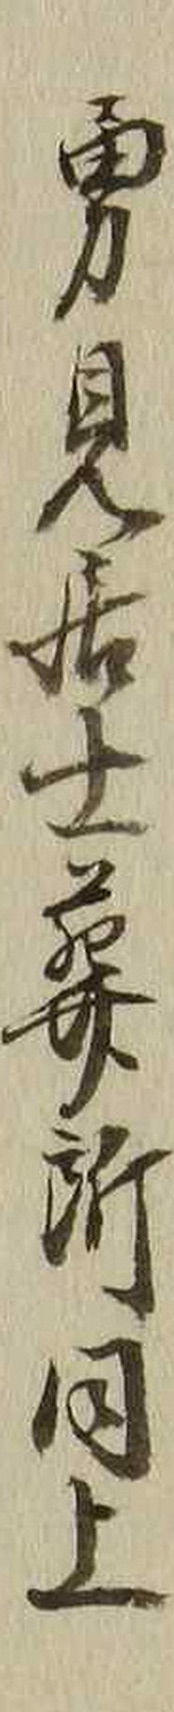勇見居士葬所同上
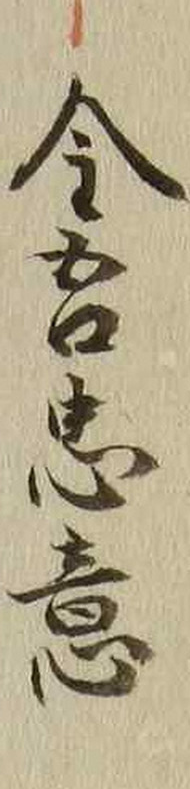金吾忠意
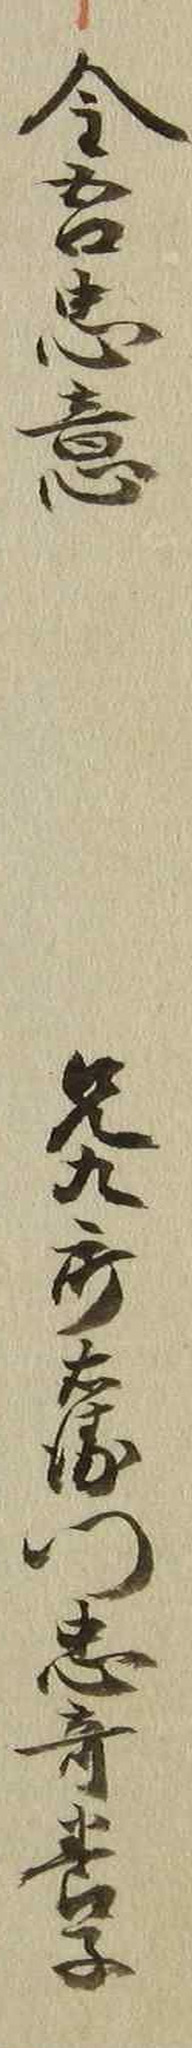金吾忠意兄九郎左衛門忠奇養子
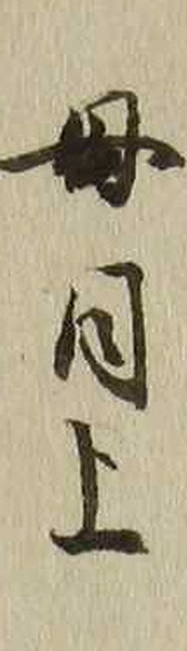母同上
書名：諸士系譜　巻之64　と之部7
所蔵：会津若松市立会津図書館
